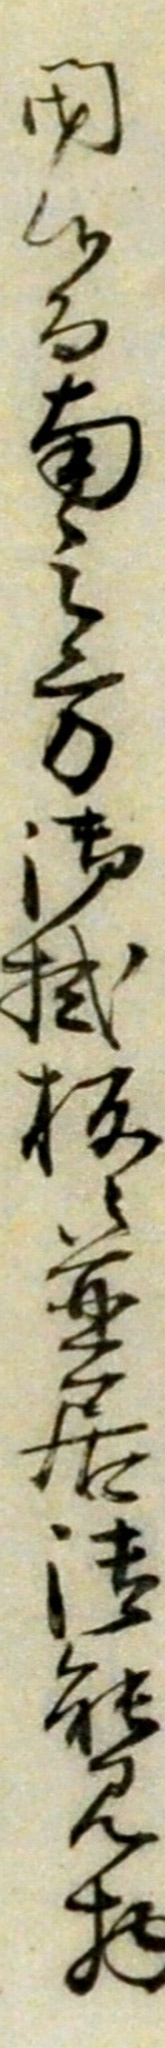閉候て南之方御拭板に並居御能見物
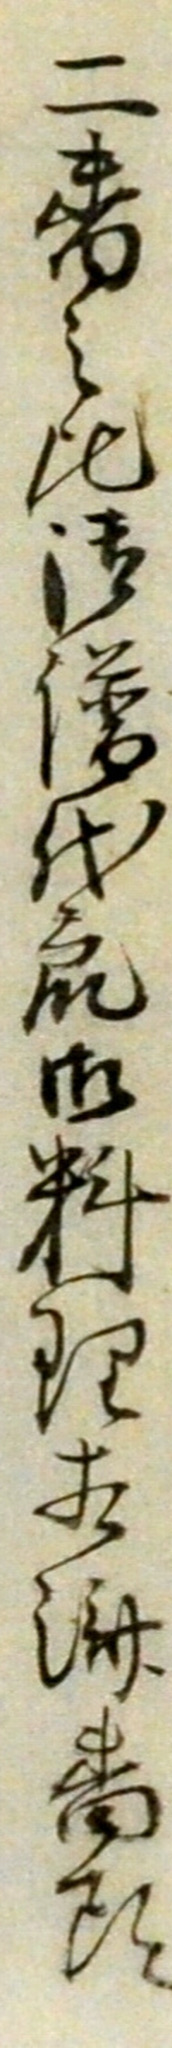二番之比御譜代衆御料理相済番頭
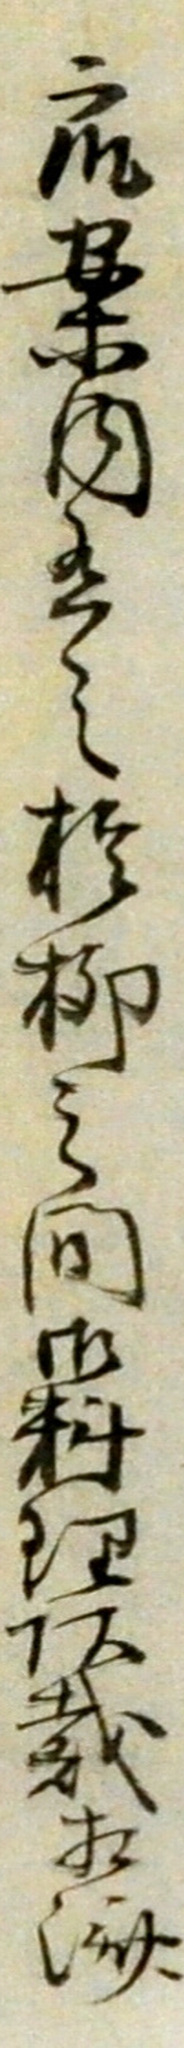衆案内有之於柳之間御料理頂戴相済
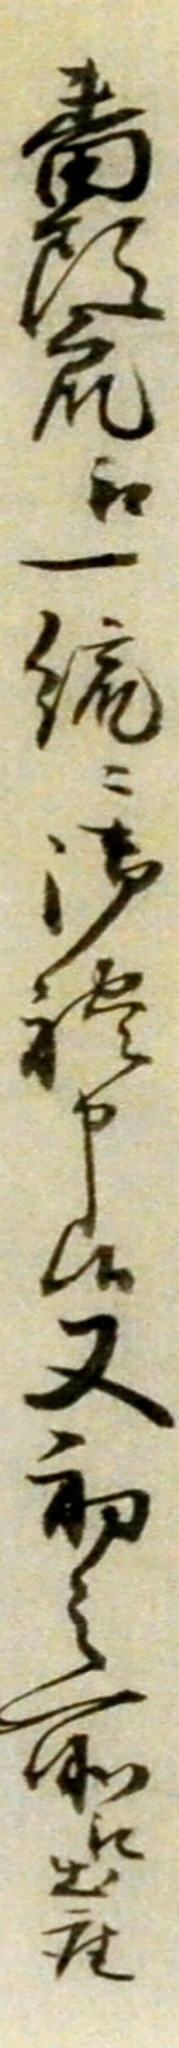番頭衆え一統に御礼申候又初之所え出座
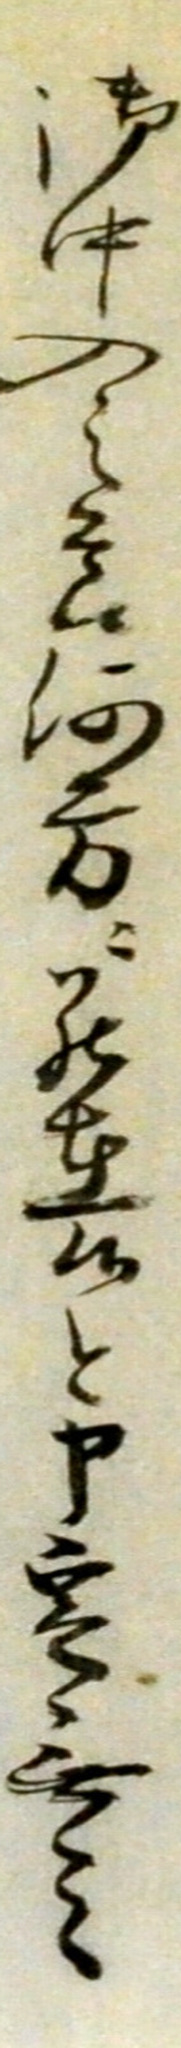御中入之節何方に罷在候と申定無之
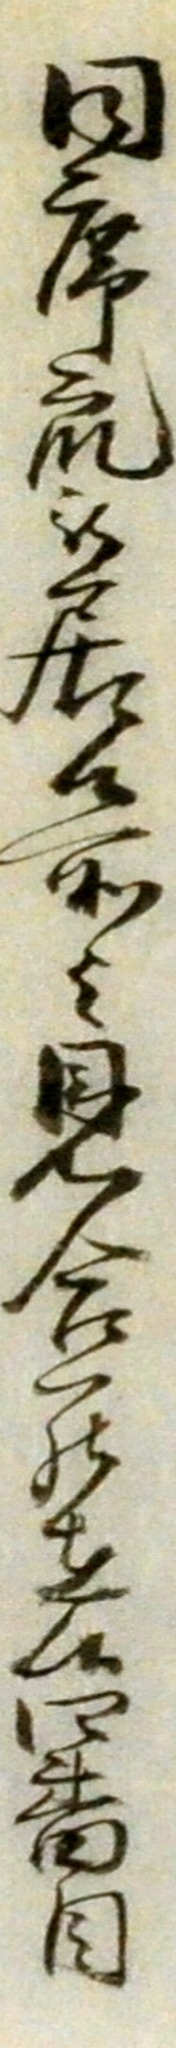同席衆被居候所と見合罷在候四番目
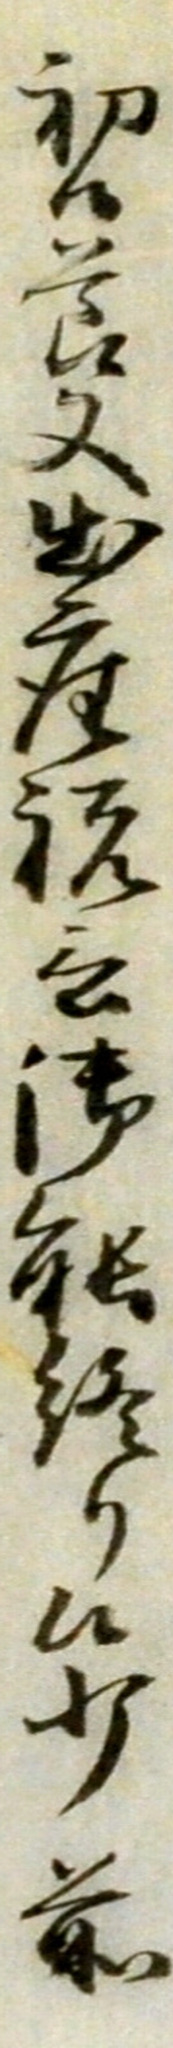初候節又出座祝言御能終り候少前
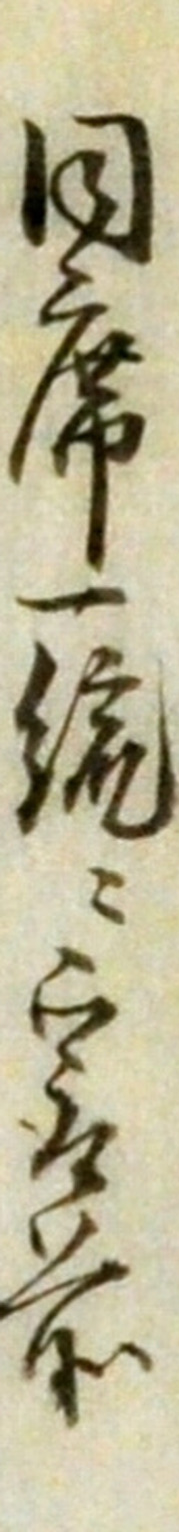同席一統に最前
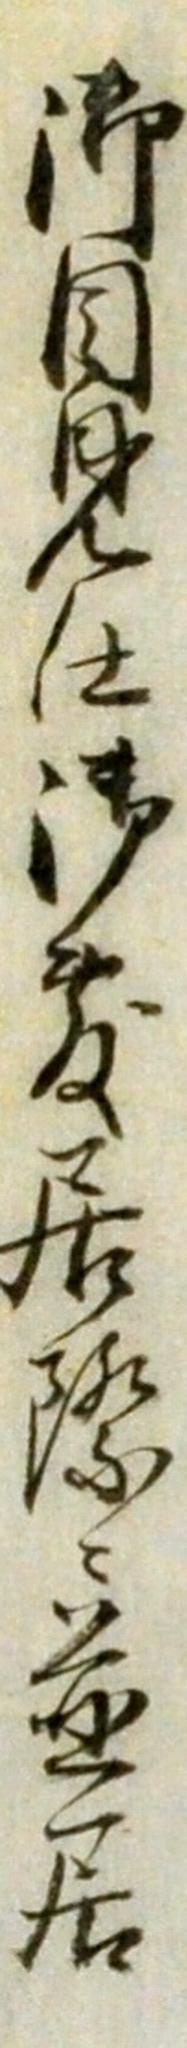御目見仕御敷居際に並居
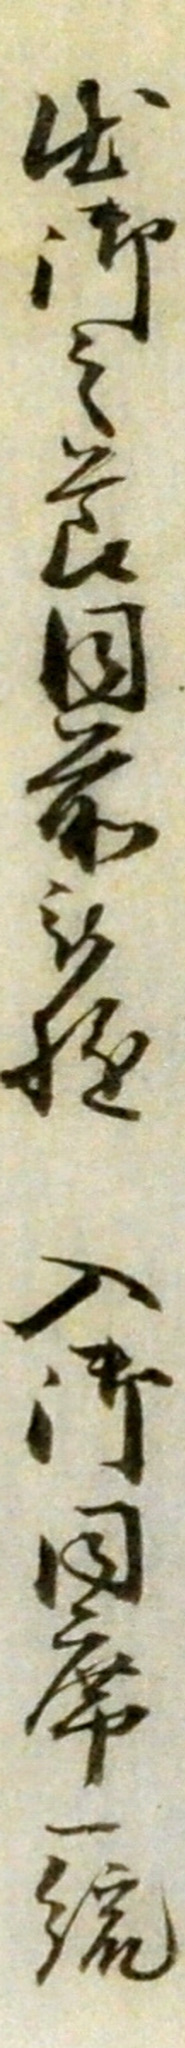出御之節同前被遊入御同席一統
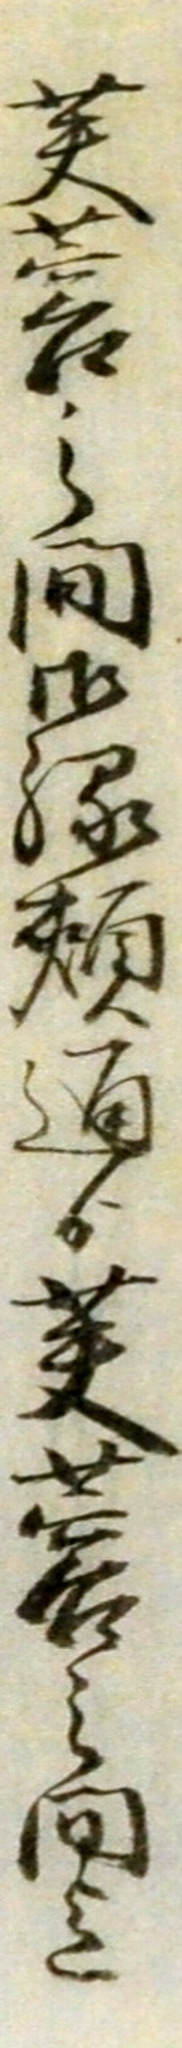芙蓉之間御縁頬通ゟ芙蓉之間迄
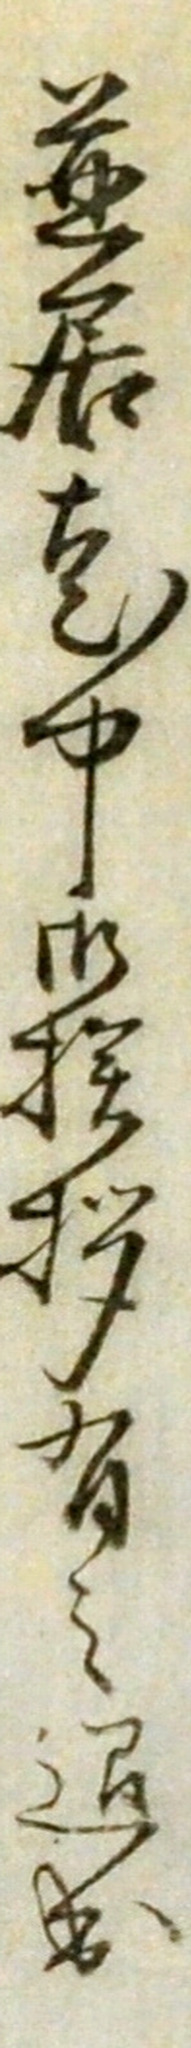並居老中御挨拶有之退出
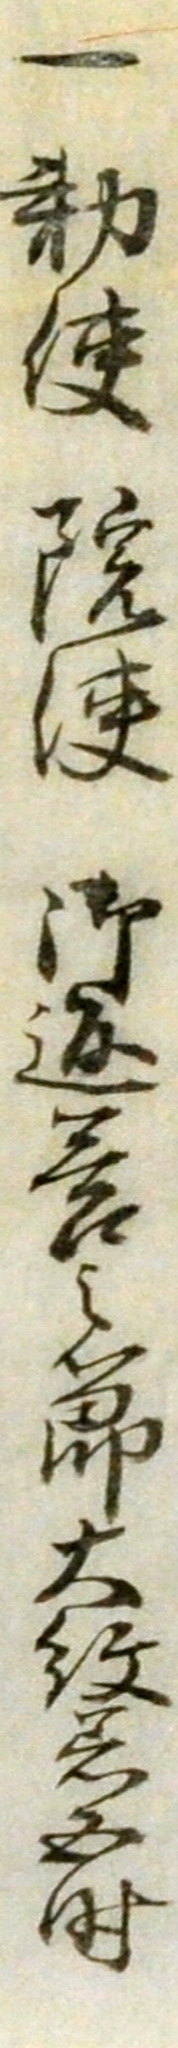一勅使院使御返答之節大紋着五時
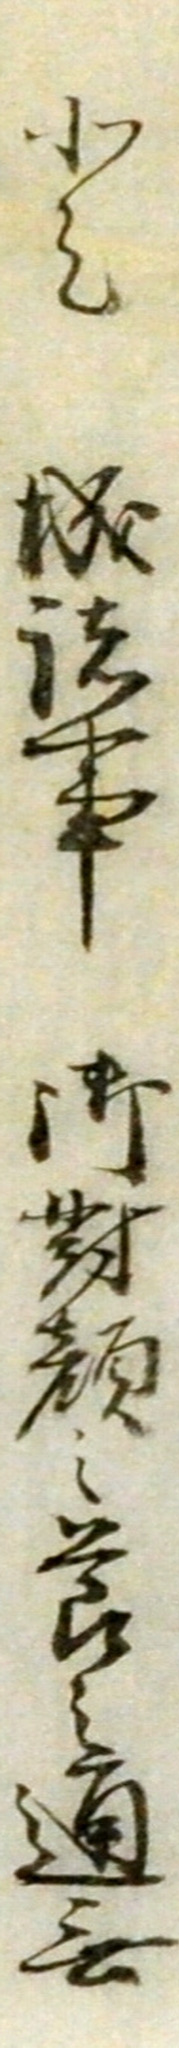登城諸事御対顔之節之通無
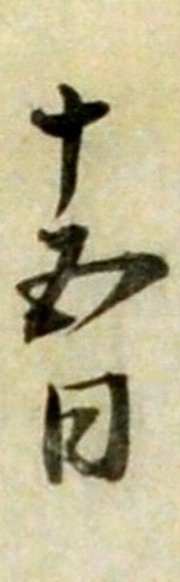十五日
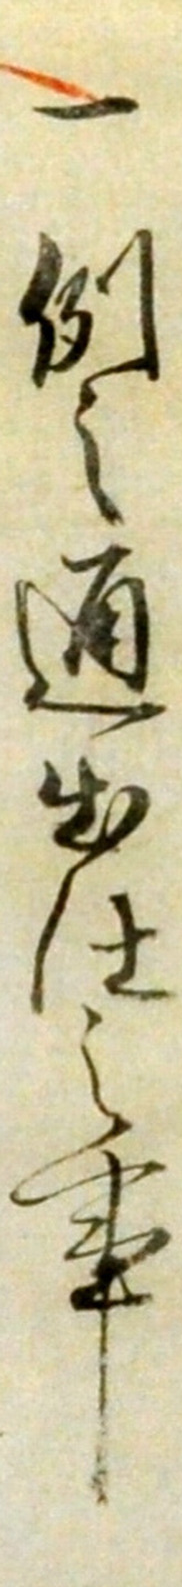一例之通出仕之事
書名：申合帳〔一括〕
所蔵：伊那市立高遠町図書館・合同会社AMANE
